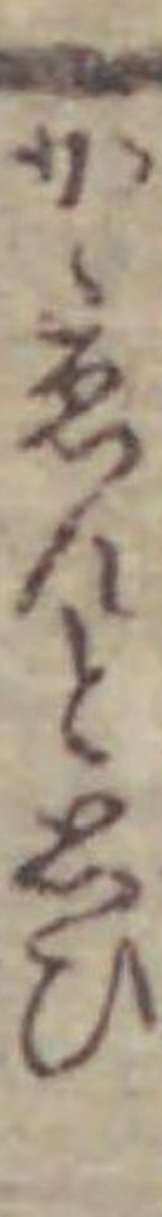かゝゑんと思ひ
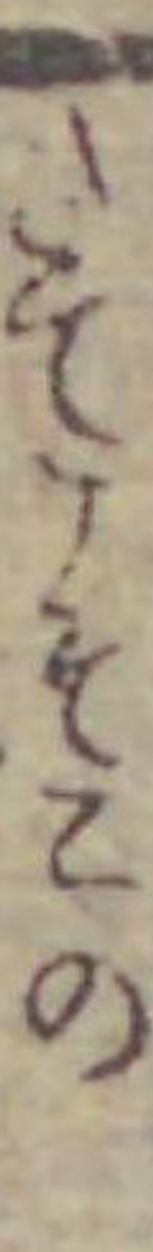たてこそこの
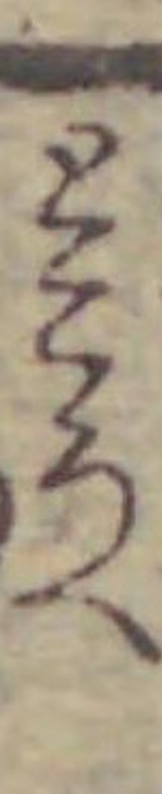ところへ
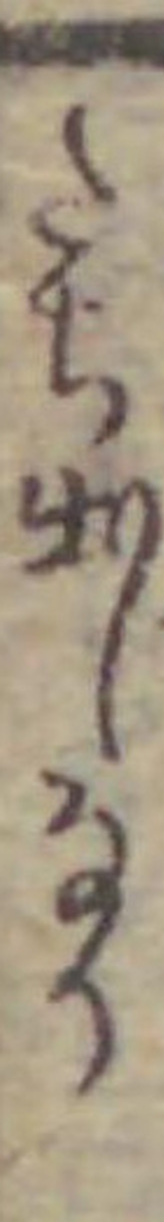たち出しなり
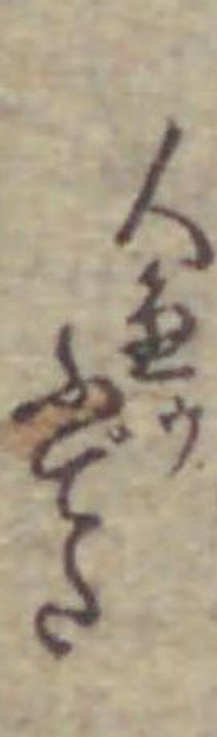ふでた
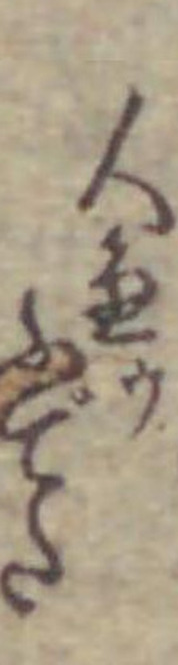ふでた
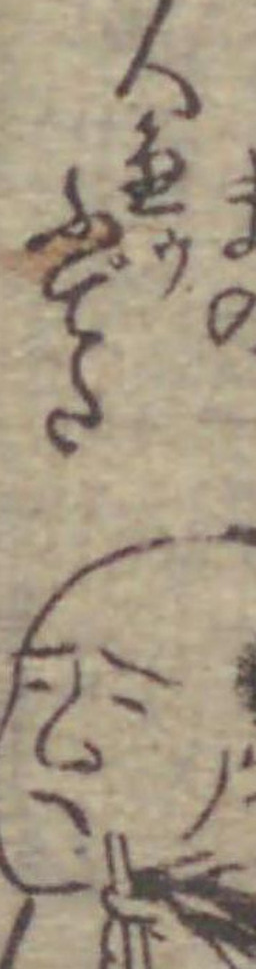ふでた
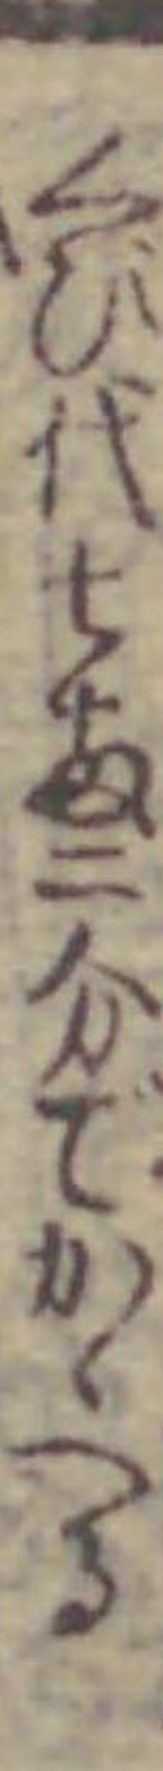くび代七両二分でかゝへる
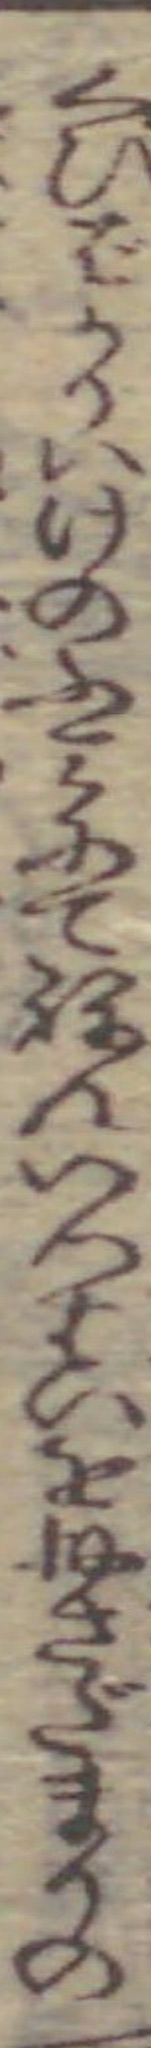くびばかりいけのふみにてねんいつはいをおさだまりの
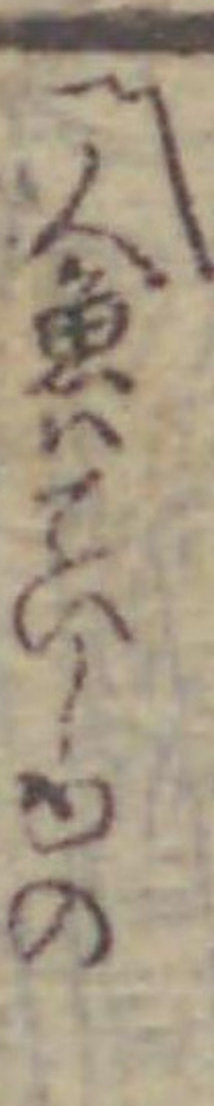〽人魚はていしゆの
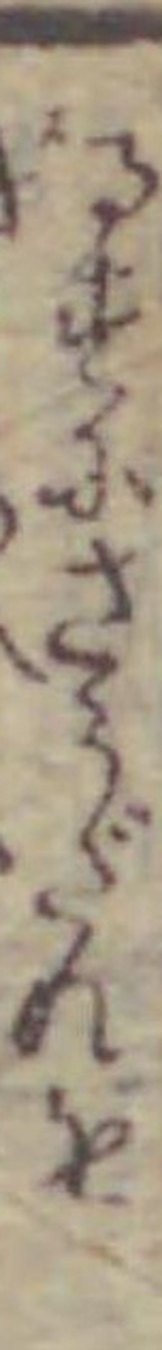るすにさうだんを
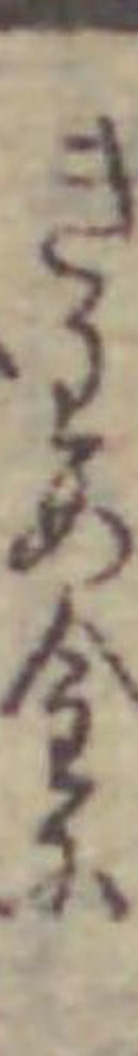きわめ金に
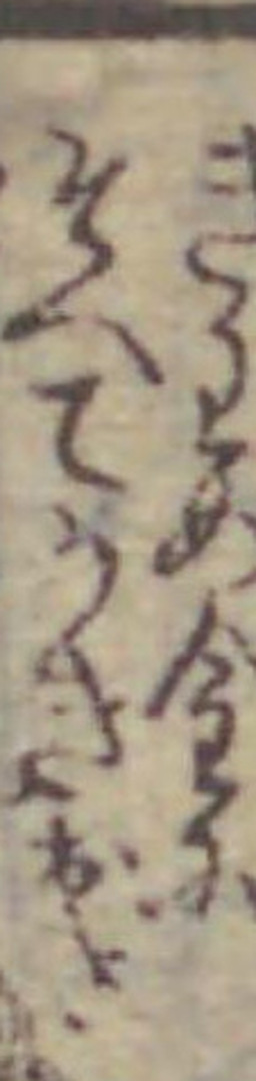そへてかきをき
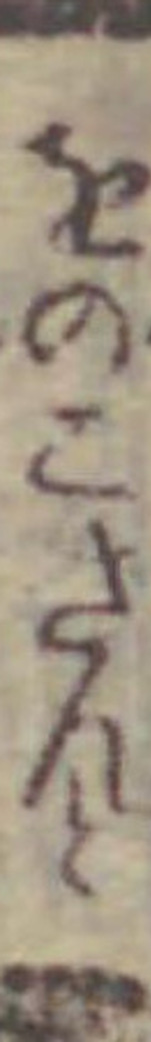をのこさんと
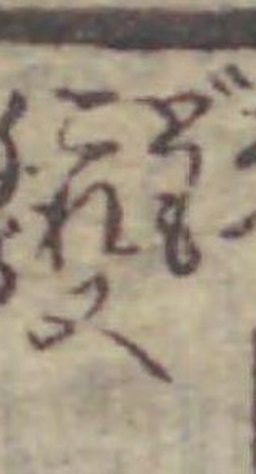これ又
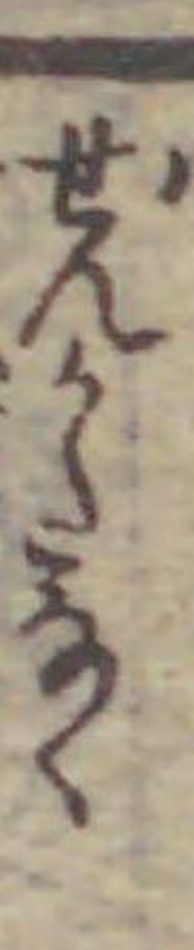せんかたなく
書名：箱入娘面屋人魚 3巻
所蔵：国立国会図書館 National Diet Library, JAPAN
